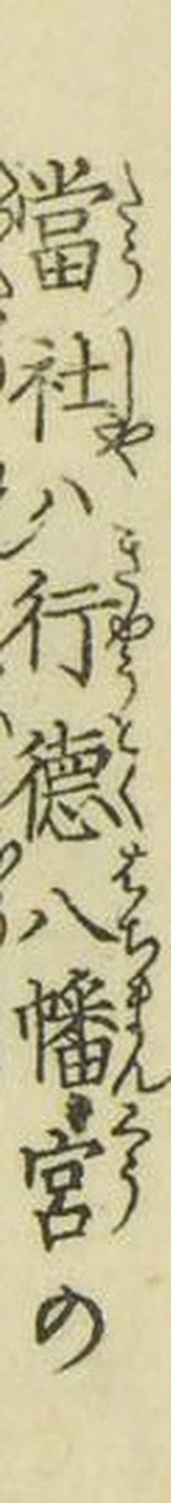当社は行徳八幡宮の
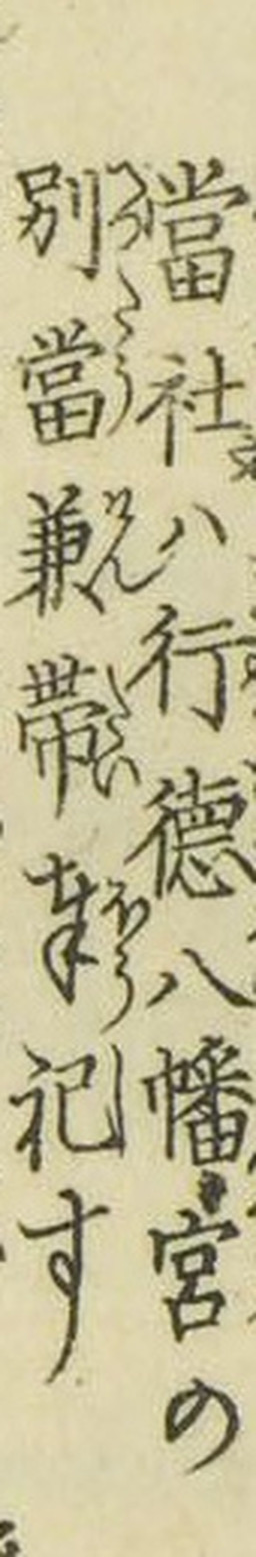別当兼帯奉祀す
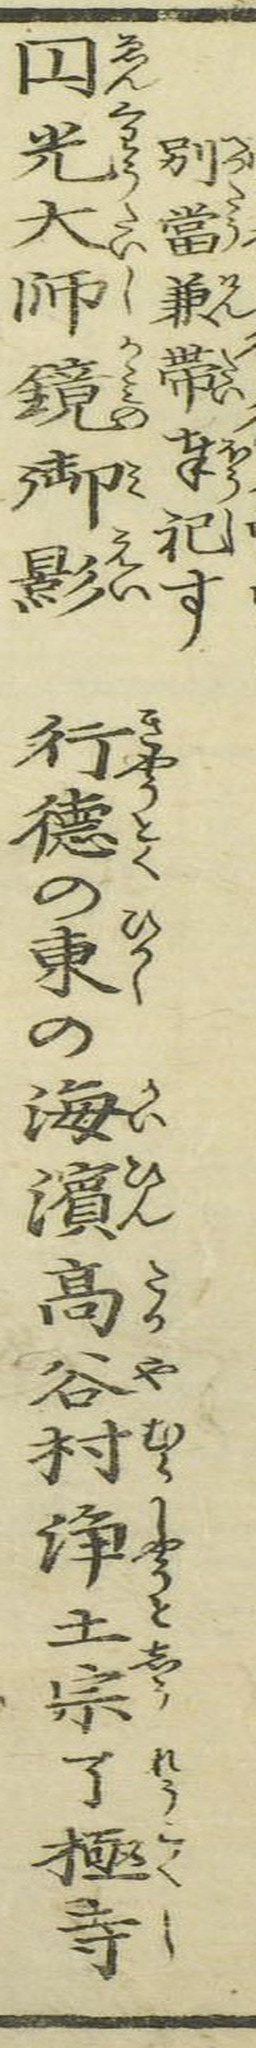円光大師鏡御影行徳の東の海浜高谷村浄土宗了楽寺
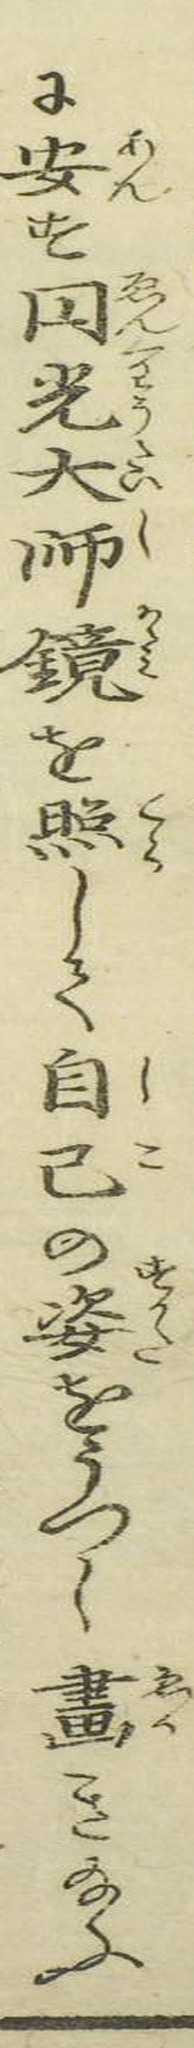に安す円光大師鏡を照して自己の姿をうつし画き給ふ
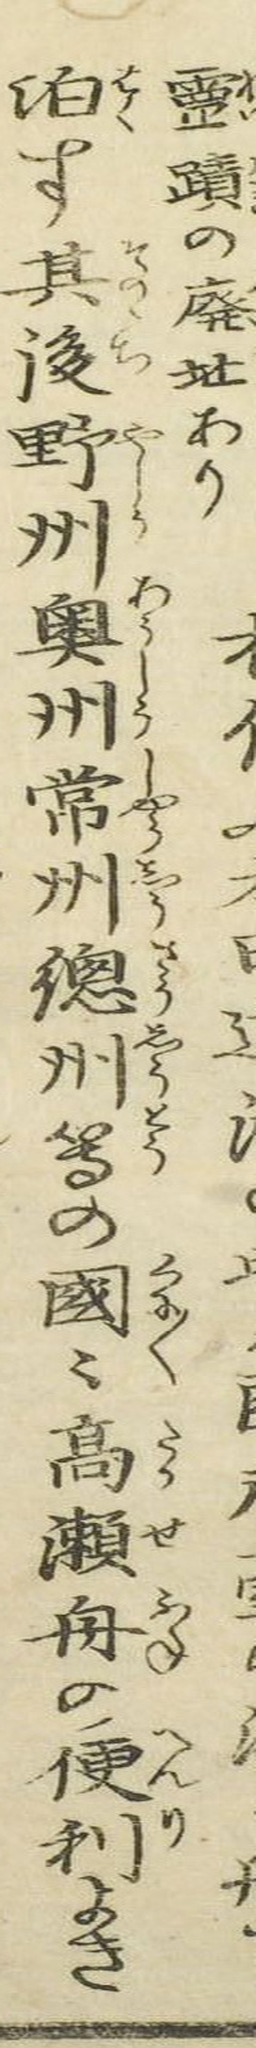泊す其後野州奥州常州総州等の国々高瀬舟の便利よき
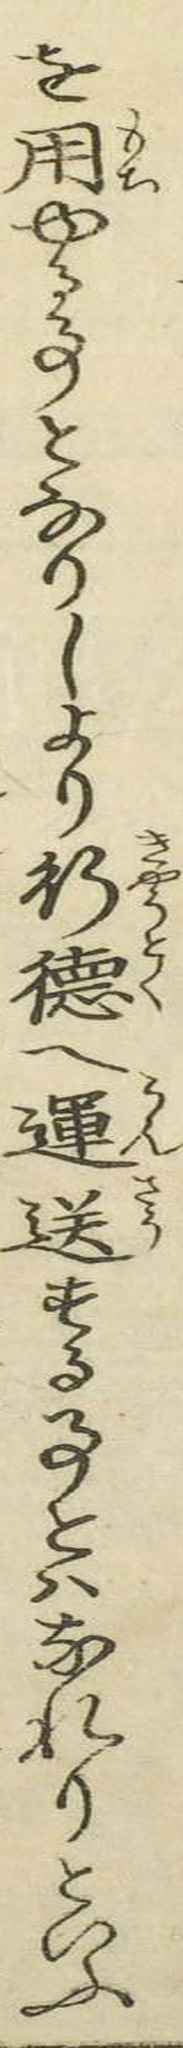を用ゆる事となりしより行徳へ運送する事とはなれりといふ
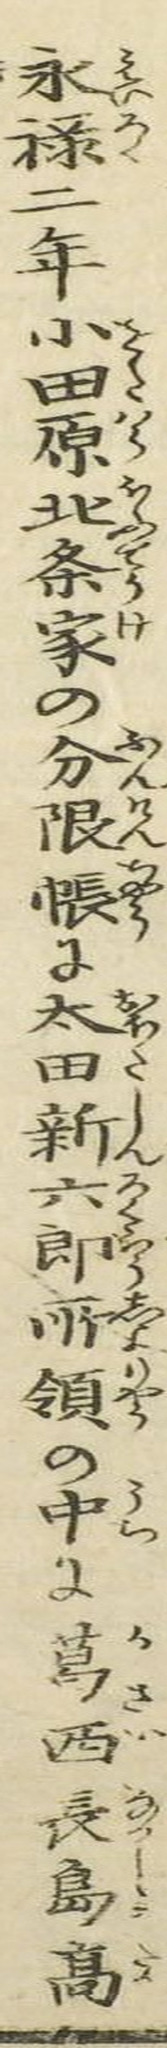永禄二年小田原北条家の分限帳に太田新六郎所領の中に葛西長島高
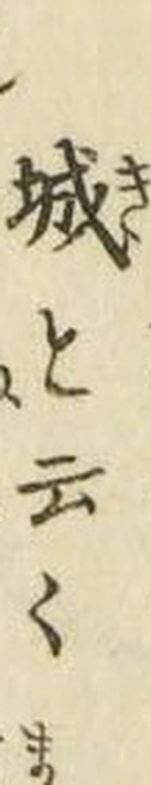城と云々
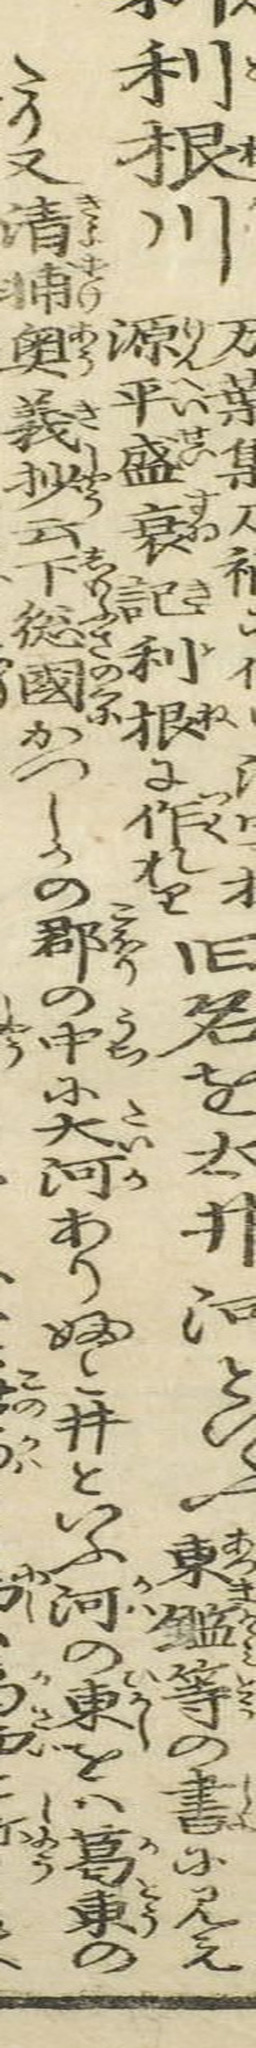たり又清輔奥義抄云下総国かつしかの郡の中に大河ありふと井といふ河の東をは葛東の
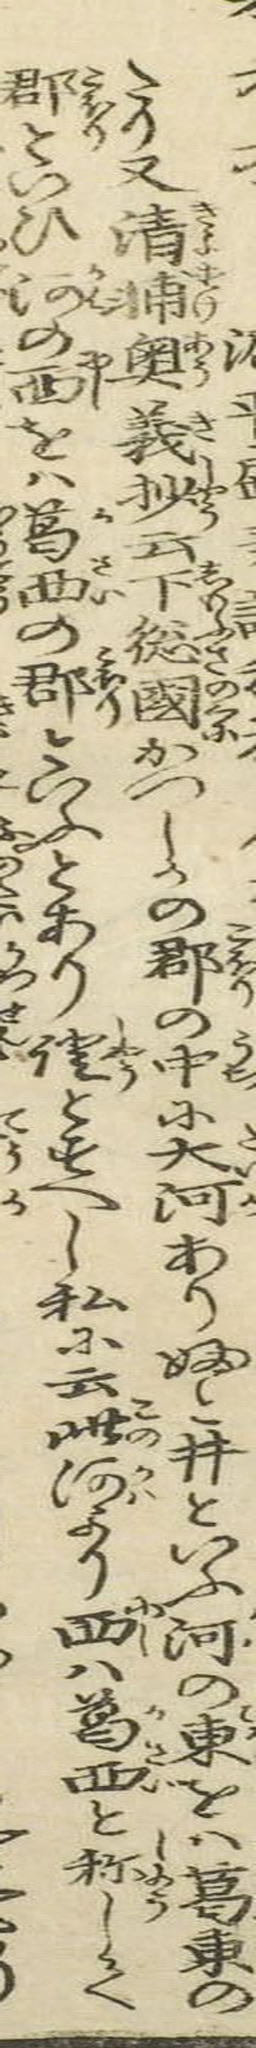郡といひ河の西をは葛西の郡といふとあり證とすへし私に云此河より西は葛西と称して
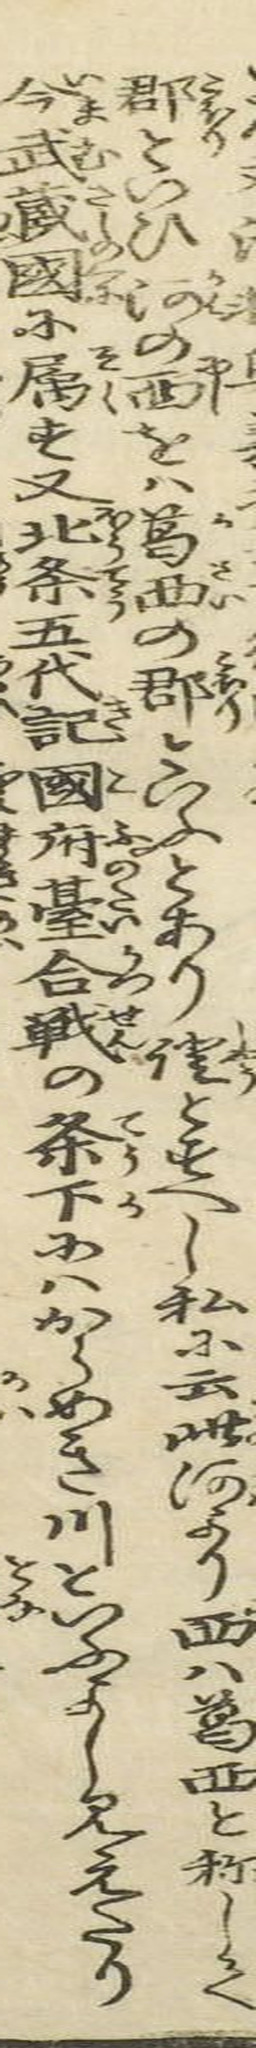今武蔵国に属す又北条五代記国府台合戦の条下にはからめき川といふよし見えたり
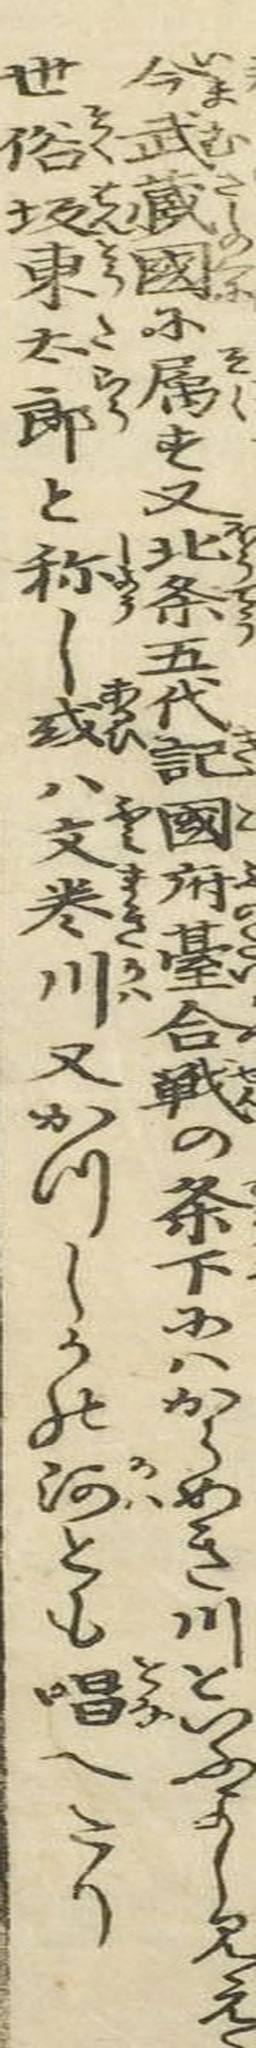世俗坂東太郎と称し或は文巻川又かつしかの河とも唱へたり
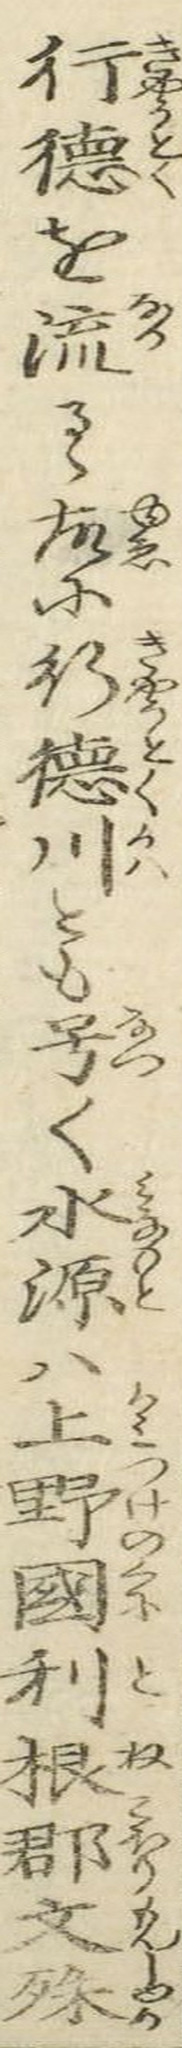行徳を流るゝ故に行徳川とも号く水源は上野国利根郡文珠
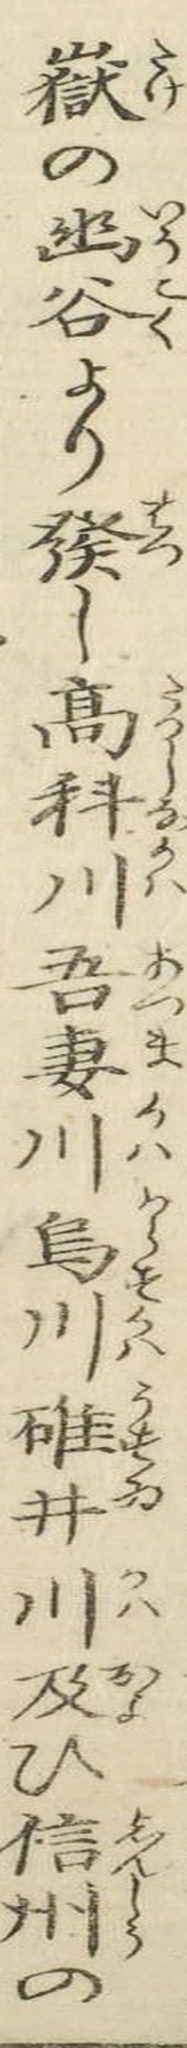嶽の幽谷より発し高科川吾妻川烏川碓井川及ひ信州の
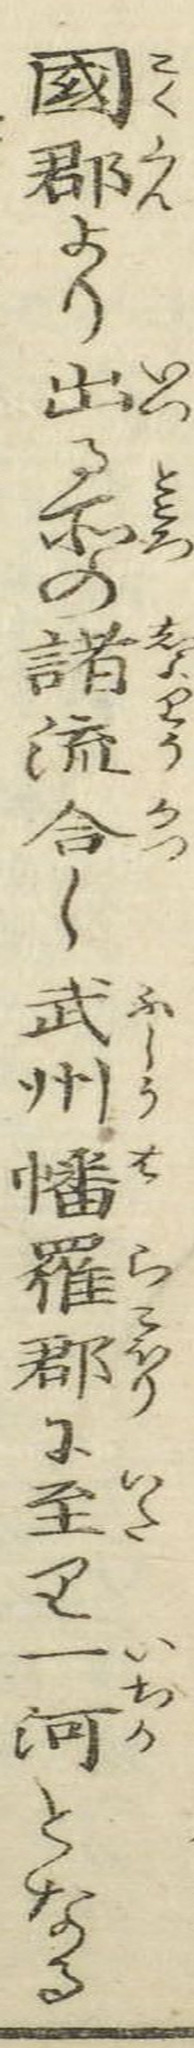国郡より出る所の諸流合し武州幡羅郡に至り一河となる
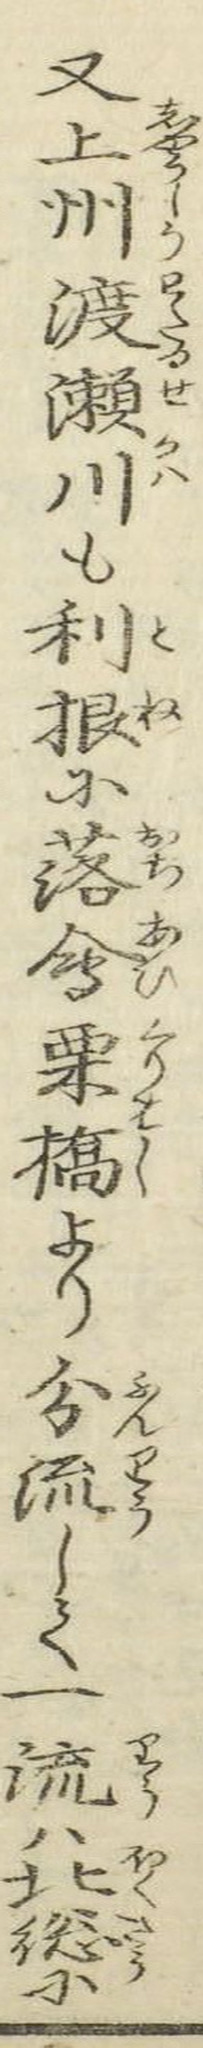又上州渡良瀬川も利根に落会栗橋より分流してい一流は北総に
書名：江戸名所図会 20巻 巻之20
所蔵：東京学芸大学教育コンテンツアーカイブ
